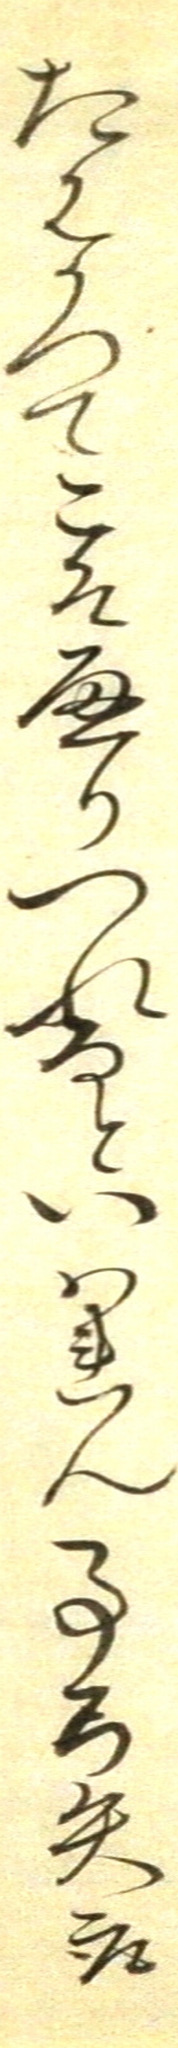たはかつてこそ通りつれなといはれん事弓矢取
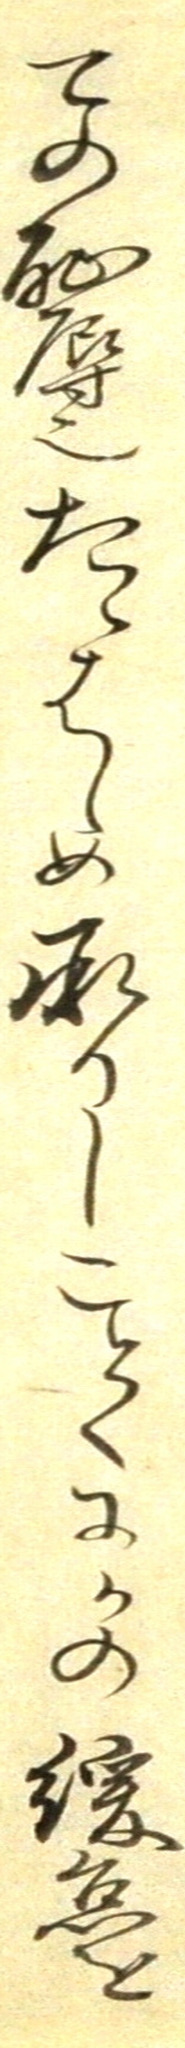ての恥辱也たゝはしめ承りしことくにかの緩怠を
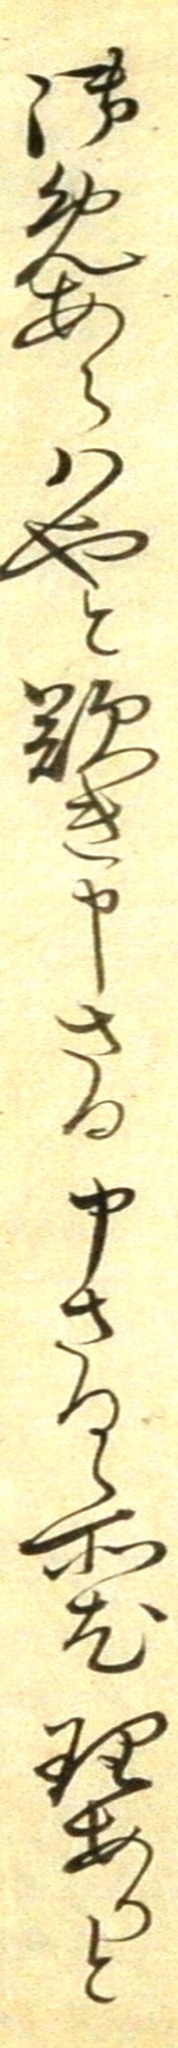御免あらはやと歎き申さる申さるゝ所尤理ありと
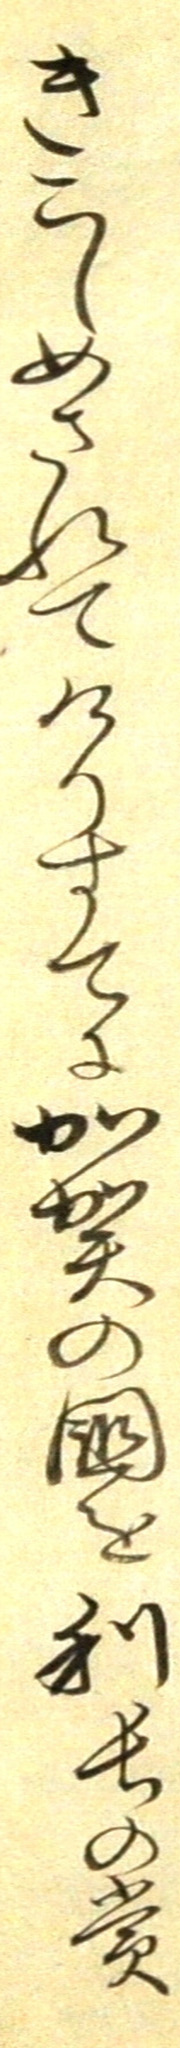きこしめされてけりすてに加賀の国を利長の賞
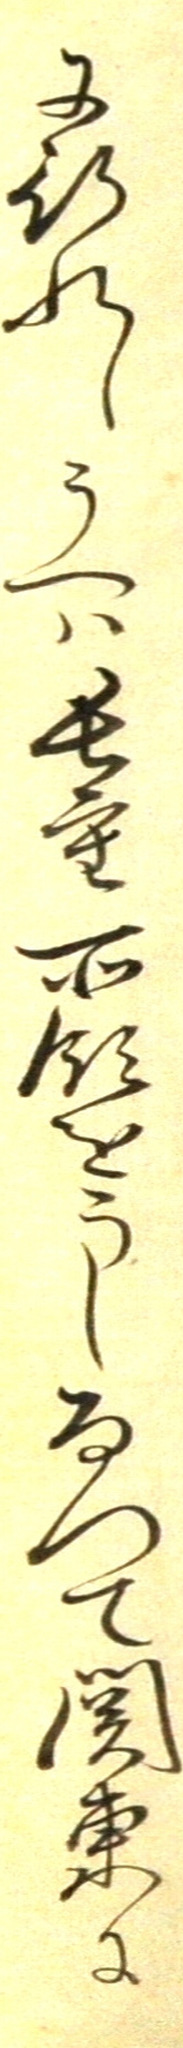に行れしうへは長重所領をうしなつて関東に

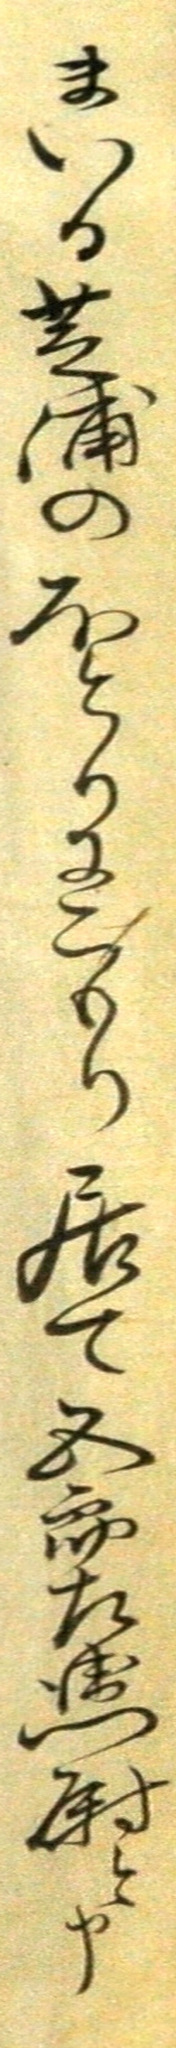まいる芝浦のほとりにこもり居て五郎左衛門尉と申
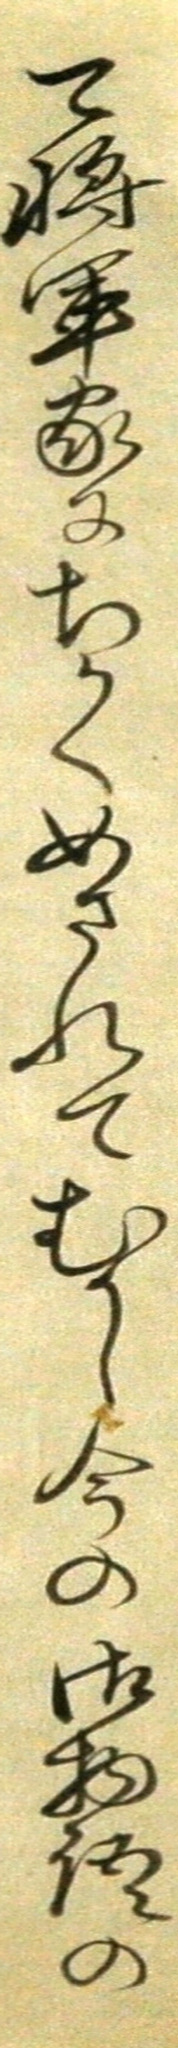て将軍家にちかくめされてむかし今の御物語の
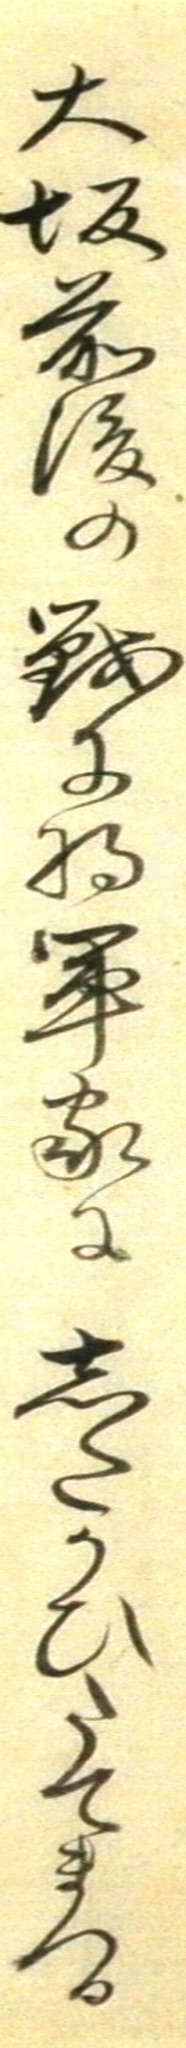大坂前後の戦に将軍家にしたかひたてまつる
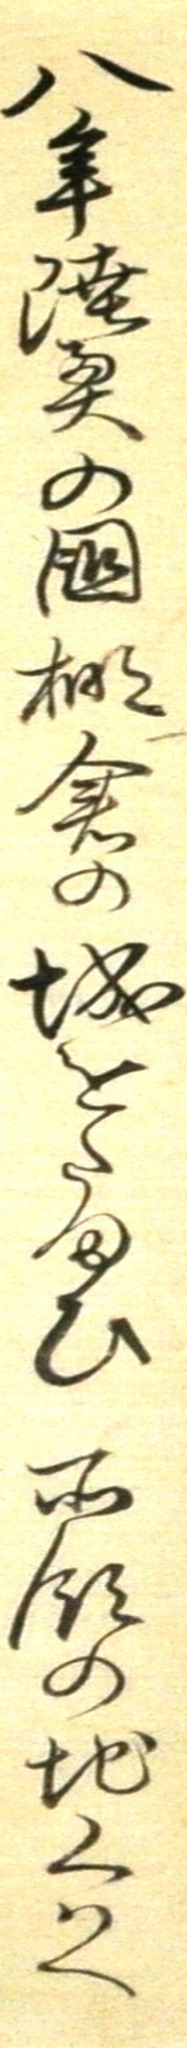八年陸奥の国棚倉の城をたまひ所領の地くはへ
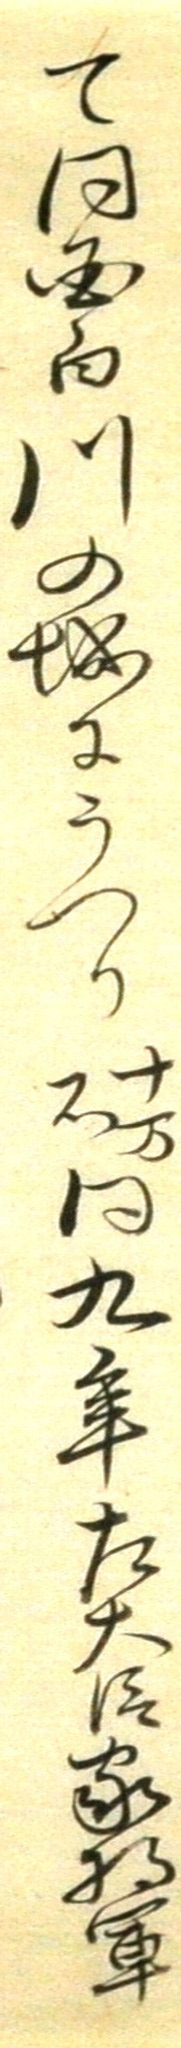て同国白川の城にうつり十万石同九年左大臣家将軍
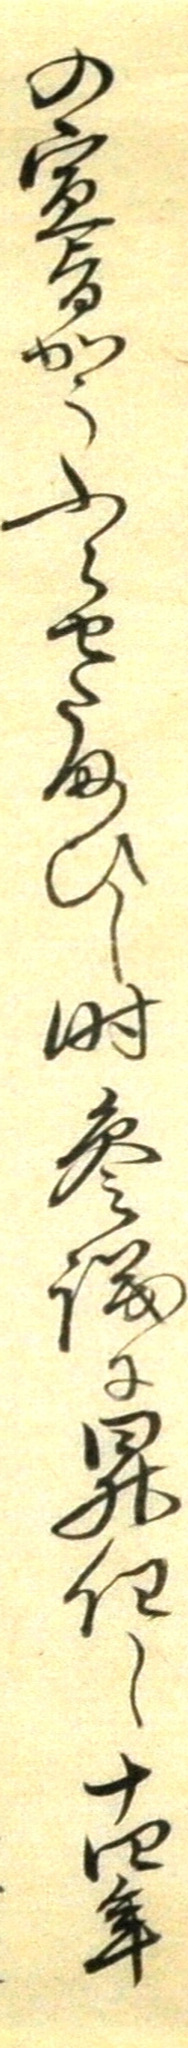の宣旨かうふらせたまひし時参議に昇任し十四年
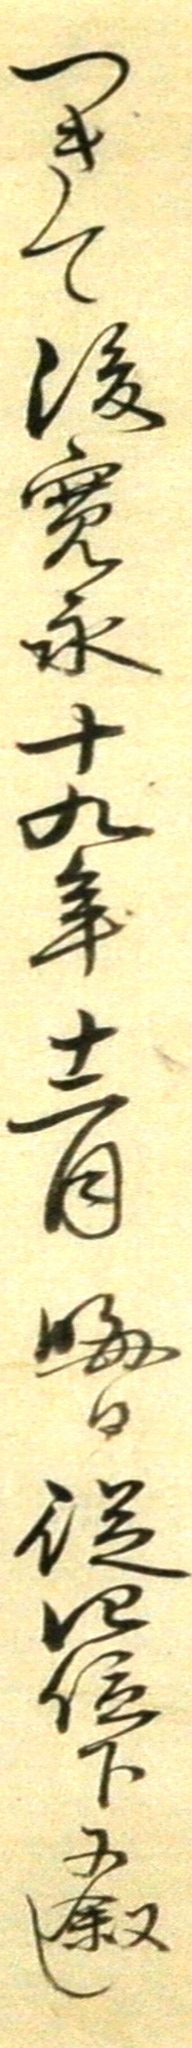つきて後寛永十九年十二月晦日従四位下に叙し
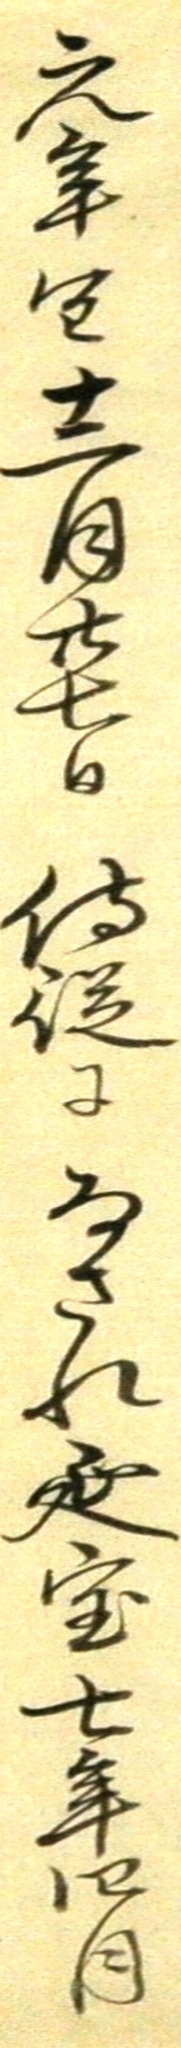元年閏十二月廿七日侍従になされ延宝七年四月
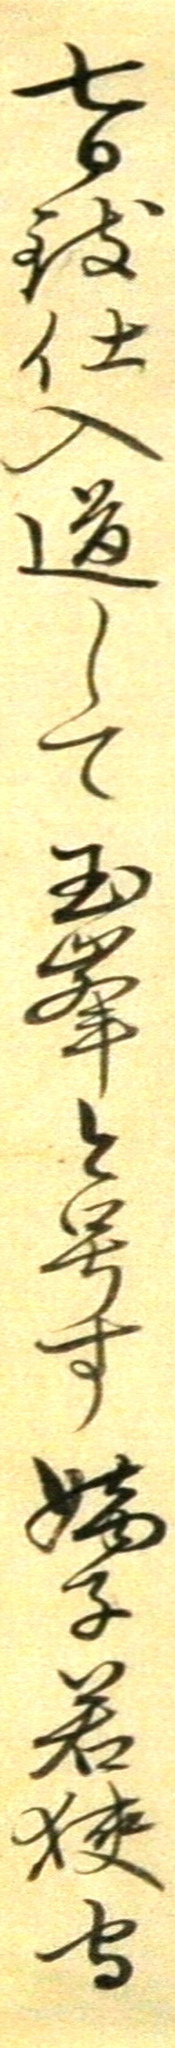七日致仕入道して玉峯と号す嫡子若狭守

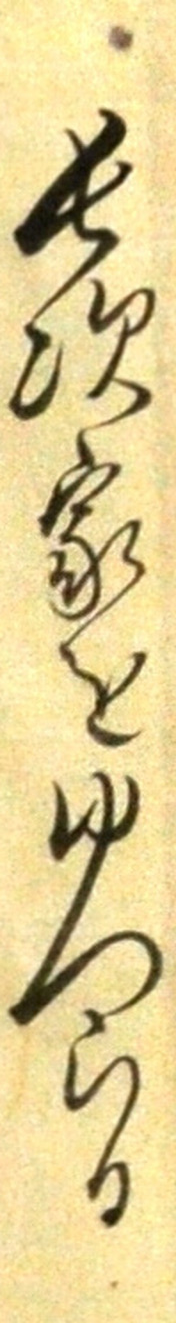長次家をゆつらる
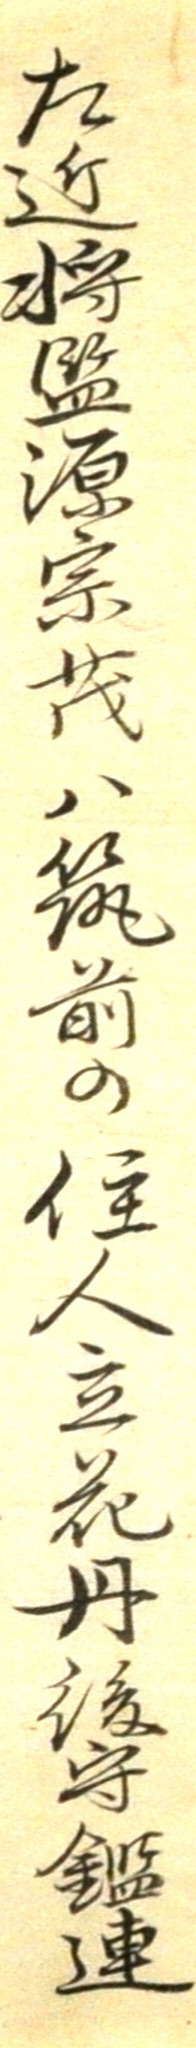左近将監源宗茂は筑前の住人立花丹後守鑑連
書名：藩翰譜（八・下）
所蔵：伊那市立高遠町図書館・合同会社AMANE
